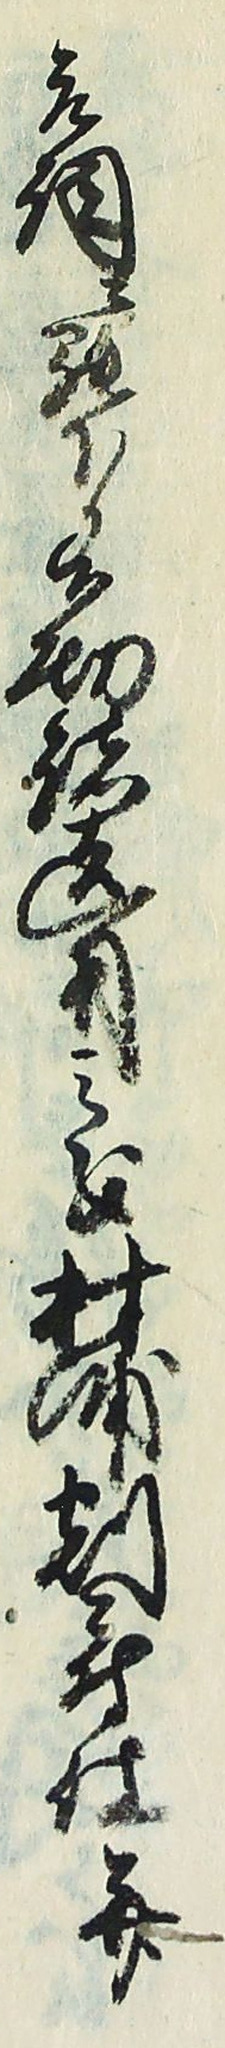取調に罷下り候砌諸造用の義村浦割符仕幷
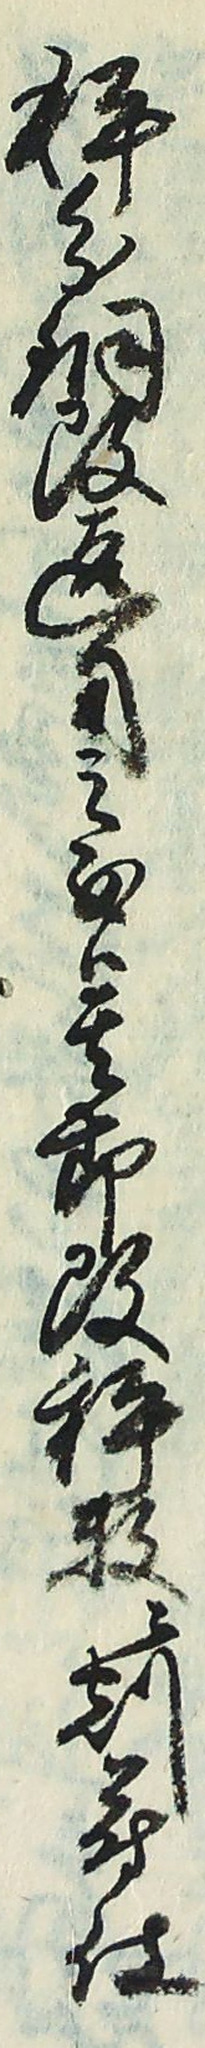秤分銅改造用の義は其節改秤数に割符仕
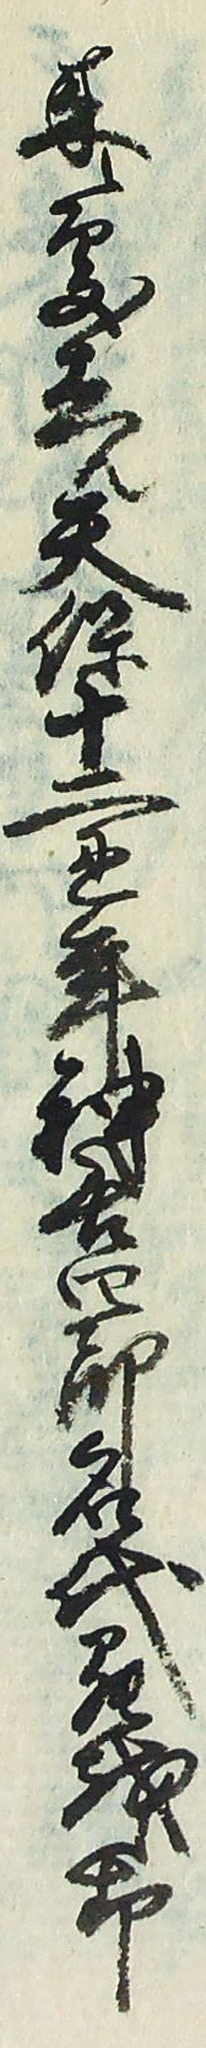来候処去る天保十二丑年神善四郎名代罷越候節
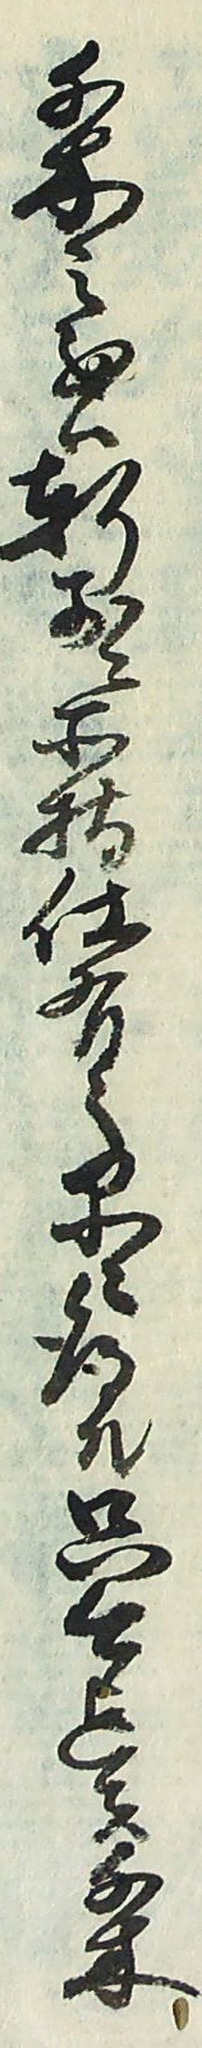千木の義は軒別に所持仕有之品に候得共只今迄は千木
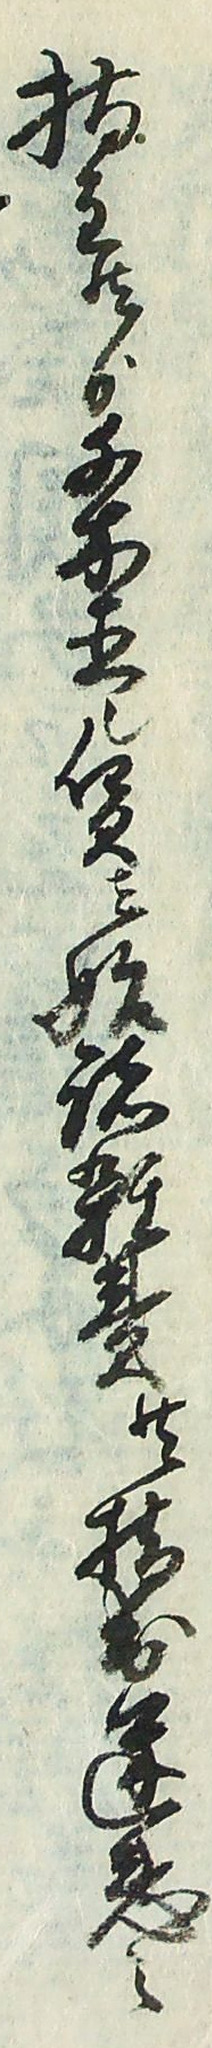持主共より千木直し賃を始諸雑費共指出迷惑の
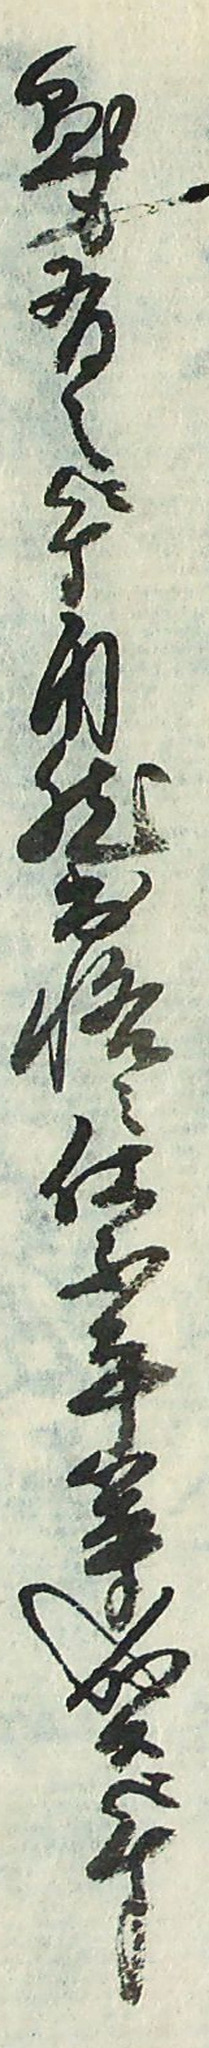懸も有之に付自然出恪み仕不平等成候に付

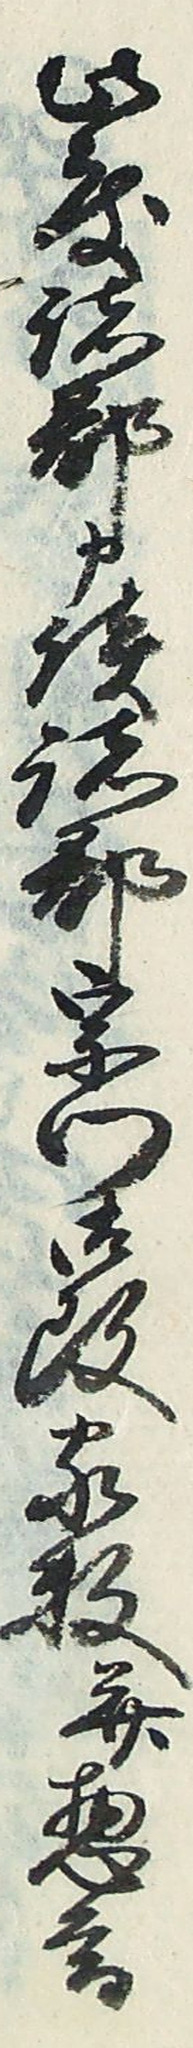此度諸郡申談諸郡宗門御改家数幷惣高
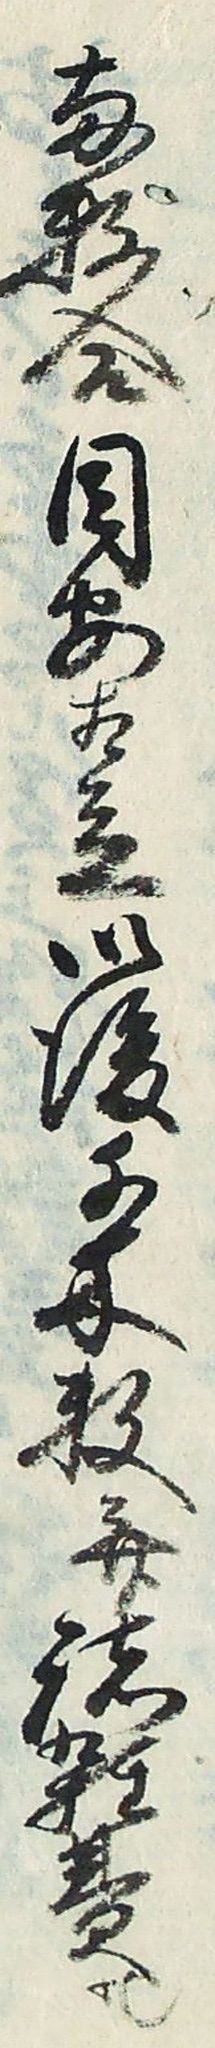両数合目安相以後千木数幷諸雑費共
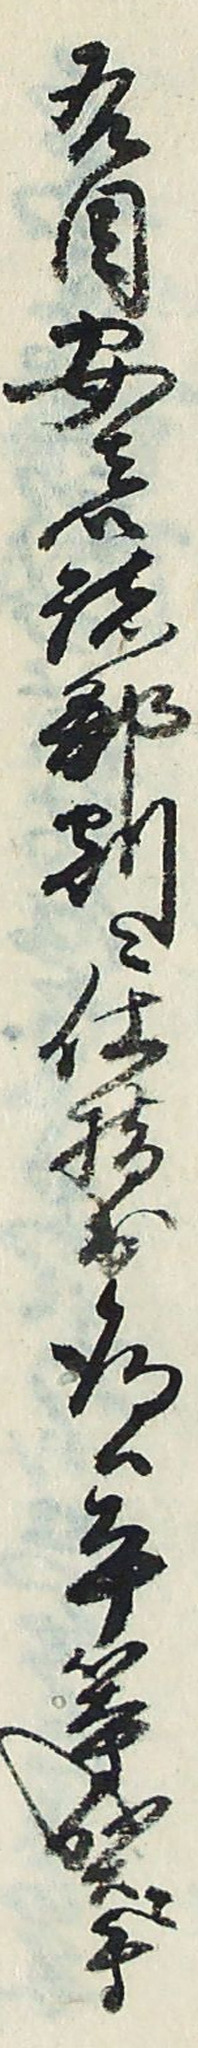右目安を以諸郡割に仕指出候得は平等成候に付
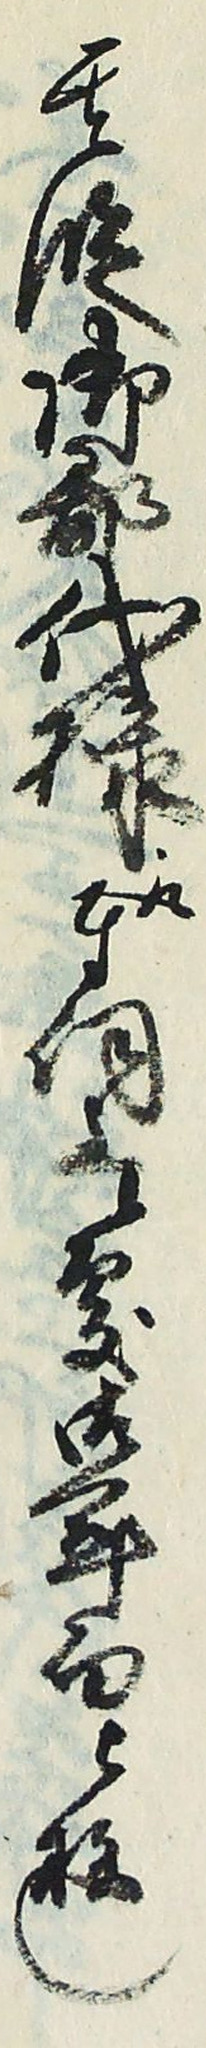其段御郡代様え奉伺上候処御聞届被遊
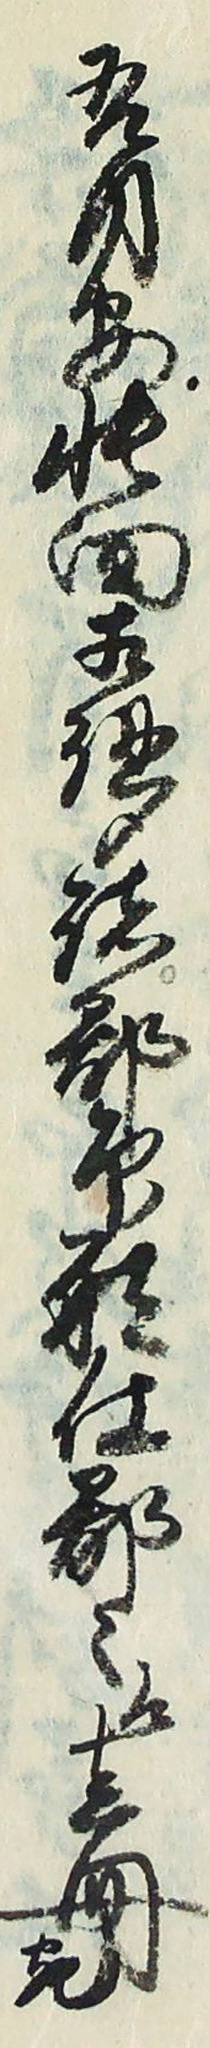右目安帳面相認め諸郡印形仕郡々え一冊宛
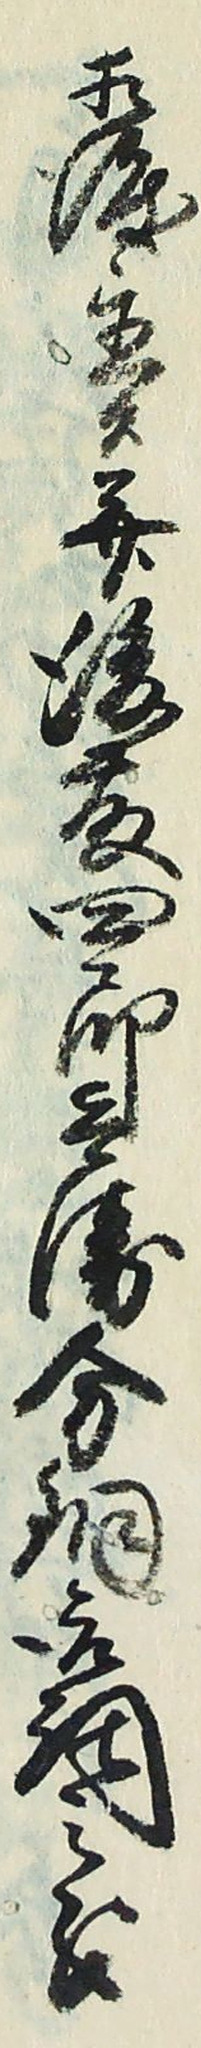相渡置候幷後藤四郎兵衛分銅取調の義
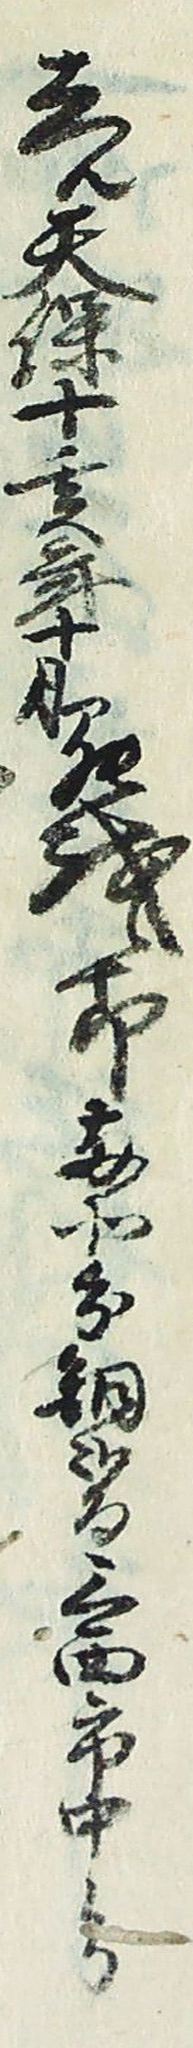去る天保十亥年十月罷越候節南北分銅二百三面市中より
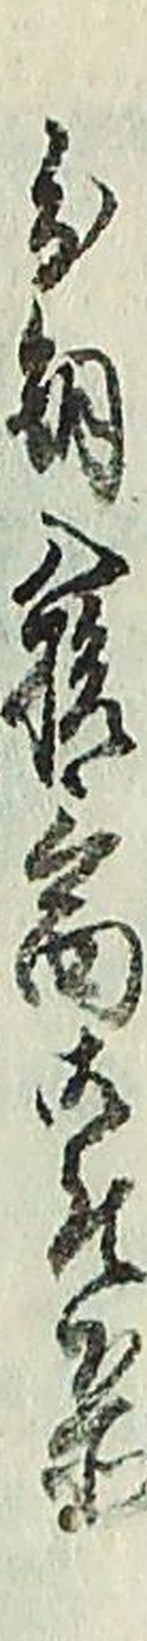分銅八十三面御座候所
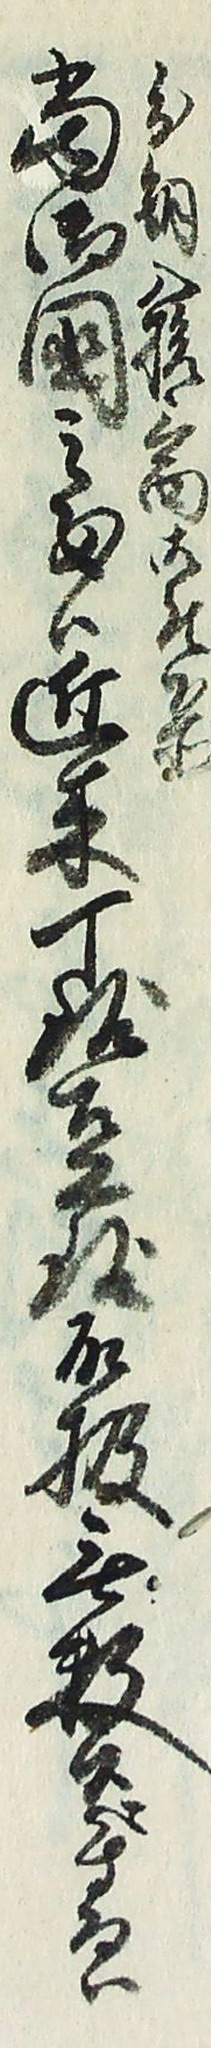当御国の義は近来丁銀豆銀取扱無数候に付ては
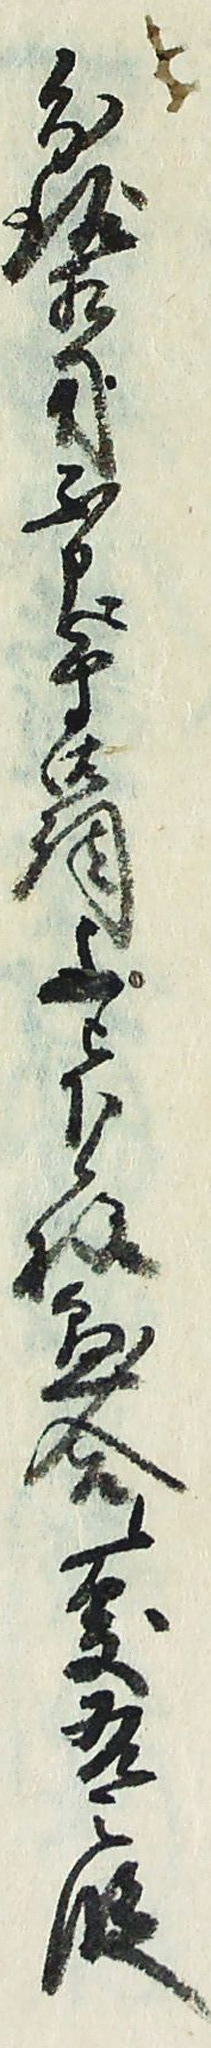分銀相用不申に付御調上被下候様懸合候処右の段
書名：諸割賦物賃銀定記録帳
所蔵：鳴門教育大学 Naruto University of Education
